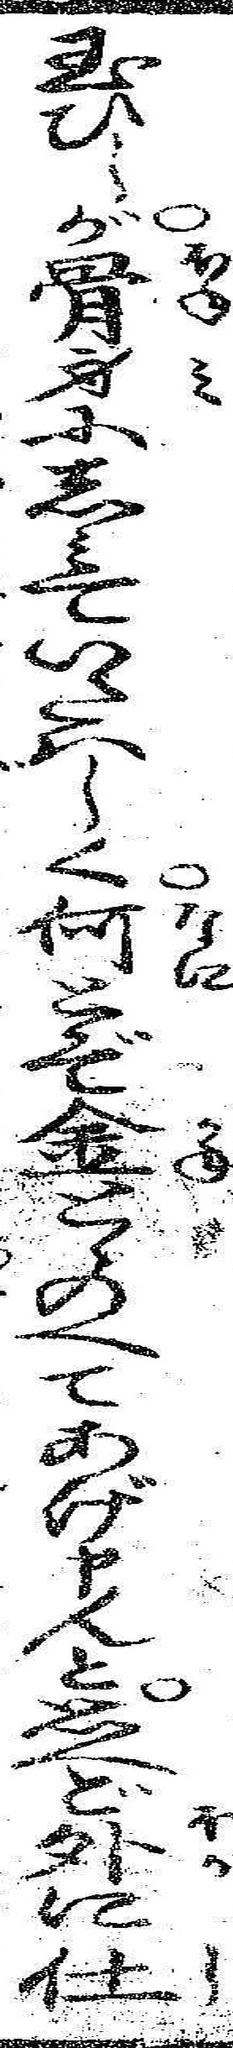玉ひしが。骨身にしみていたはしく。何とぞ金とゝのへてあげ申んと。思へど外に仕
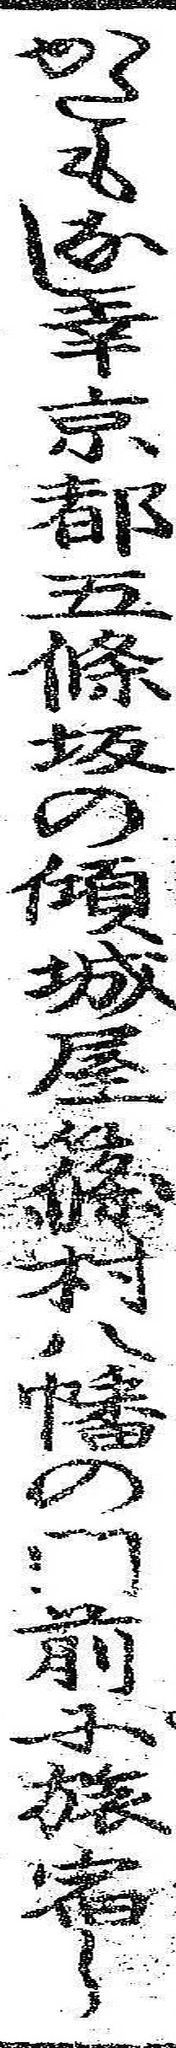かたもなし。幸京都五条坂の傾城屋。篠村八幡の門前に。旅宿し

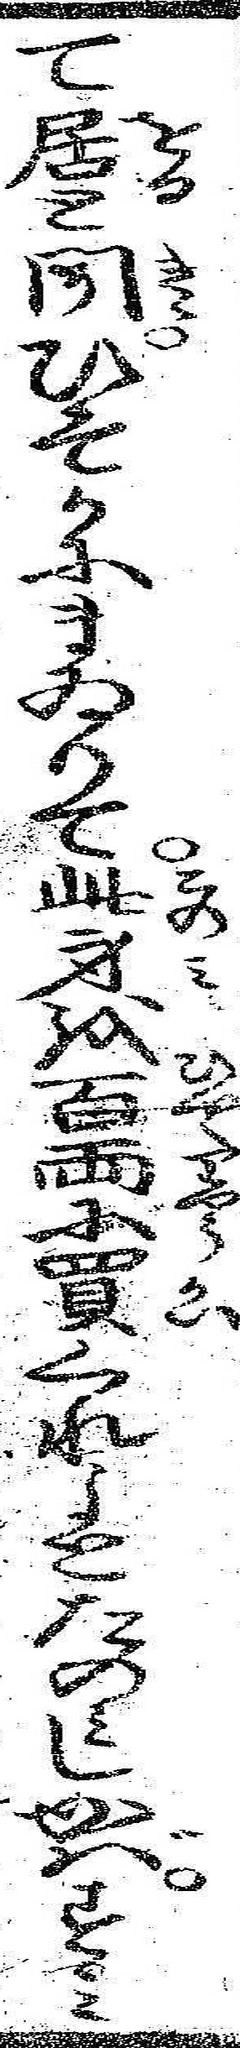て居と聞。ひそかにまゐりて。此身を百両に買くれよとたのみしかば。すみ
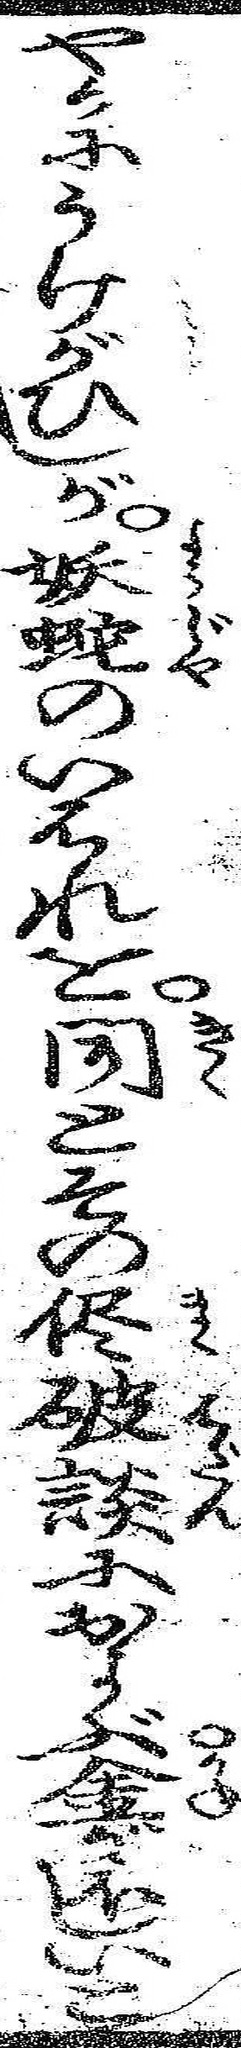やかにうけがひしが。妖蛇のいはれを。聞とその侭破談におよぶ。金がほしいと
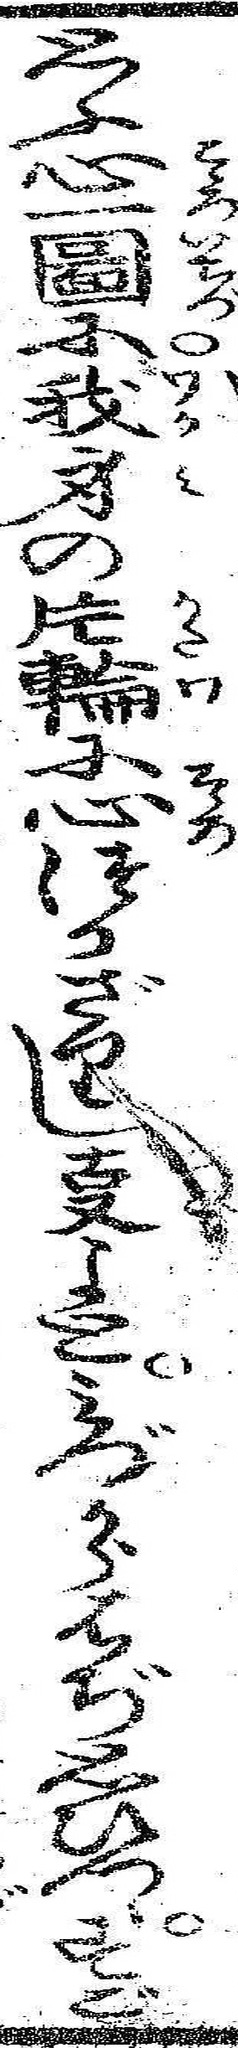思ふ心一図に。我身の片輪に心つかざりし事よと。みづからはぢ思ひつゝ。すご
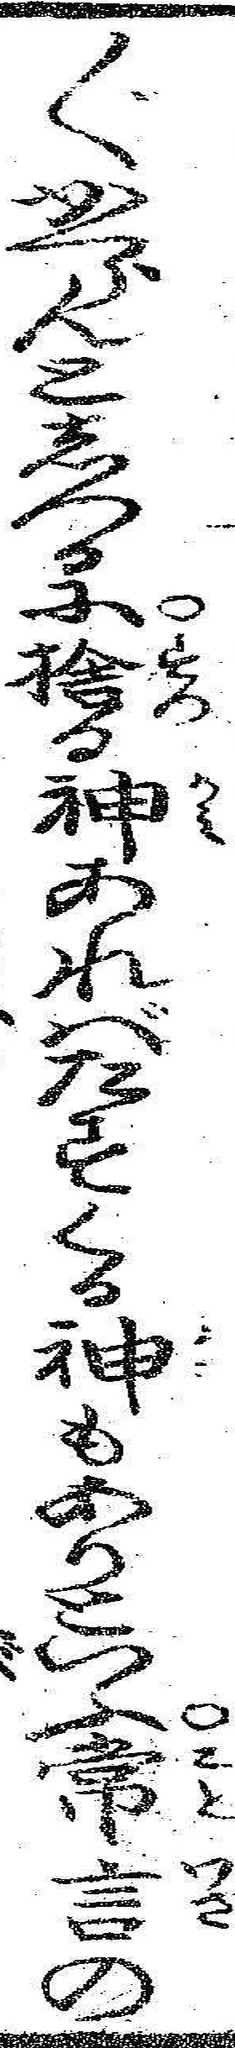〴〵かへらんとしつるに。捨る神あればたすくる神もありといふ。常言の
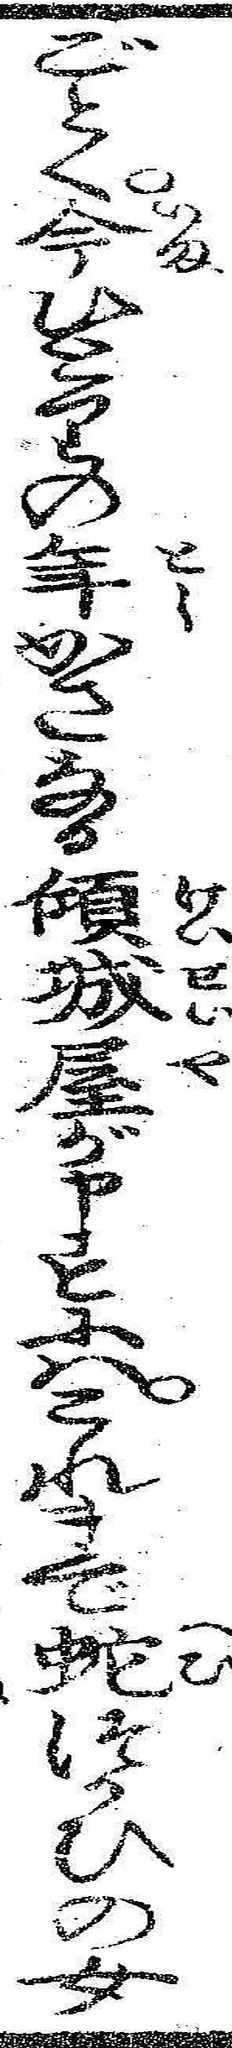ごとく。今ひとりの年かさなる傾城屋が申すには。これまで蛇つかひの女
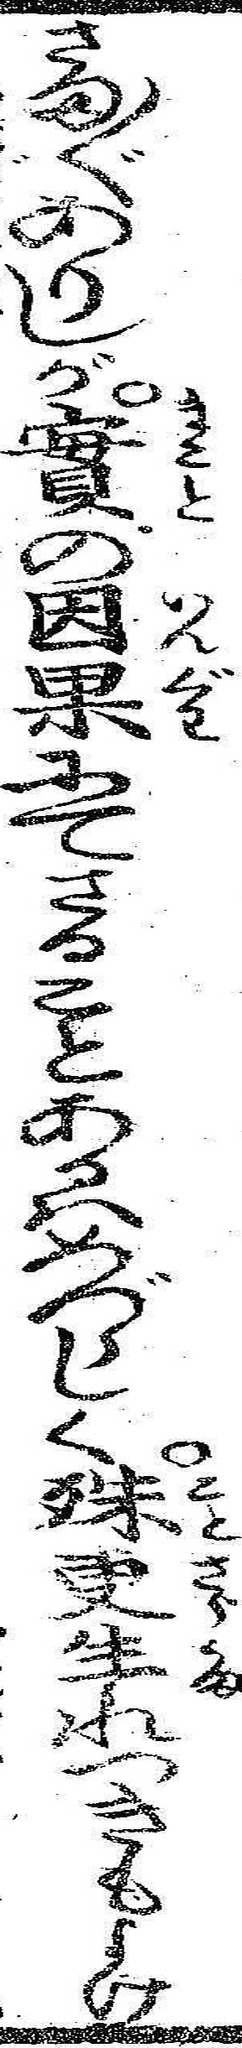さま〴〵ありしが。実の因果にてさることあるはめづらしく。殊更生れつきもよけ
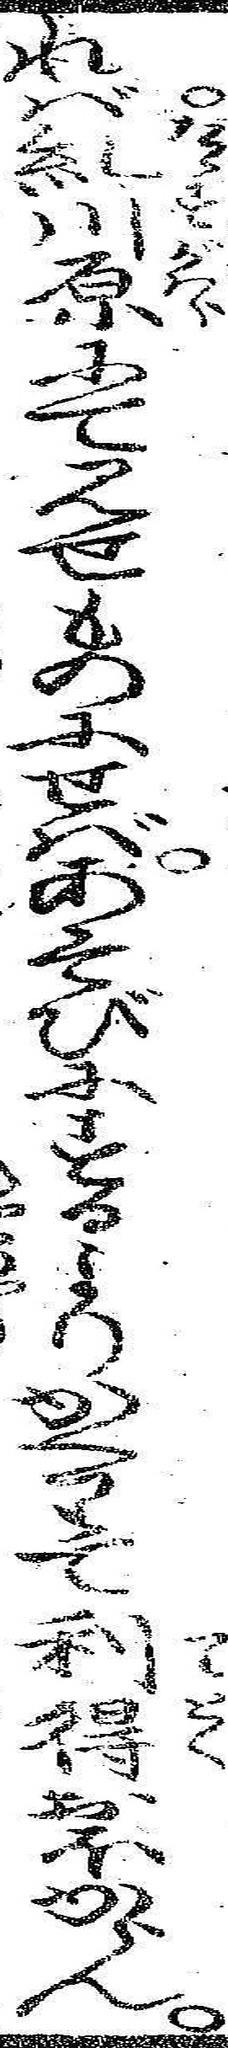れば。糺川原にて見せものにせば。あそびにするよりかへりて利得おほからん。
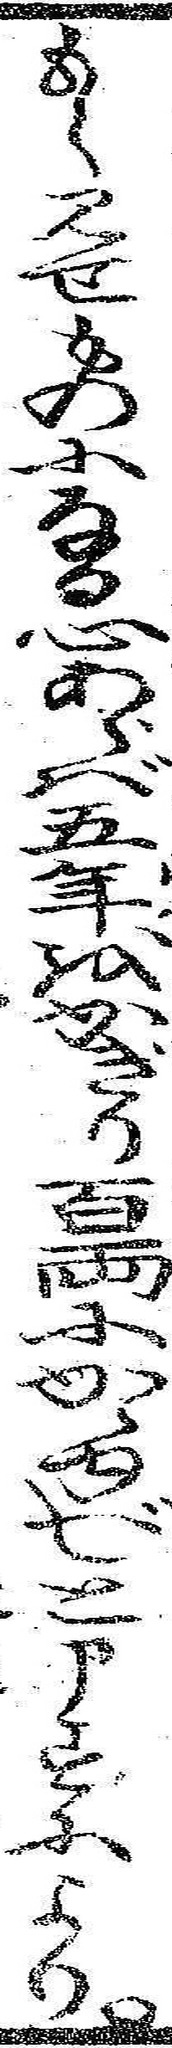もし見せものになる心あらば。五年をかぎり百両にかゝゆべしと申すにより。
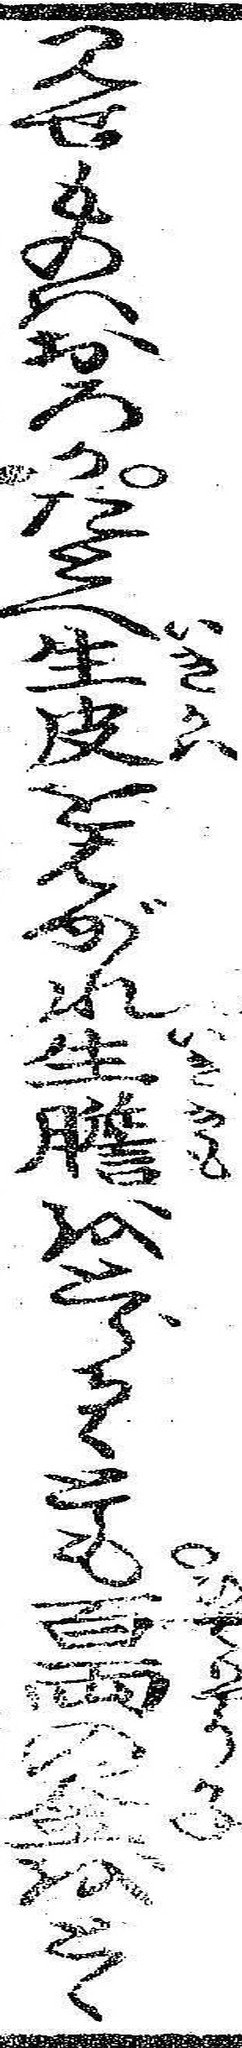見せものはおろか。たとへ生皮をはがれ。生胆をとらるゝとも。百両の金をとゝ
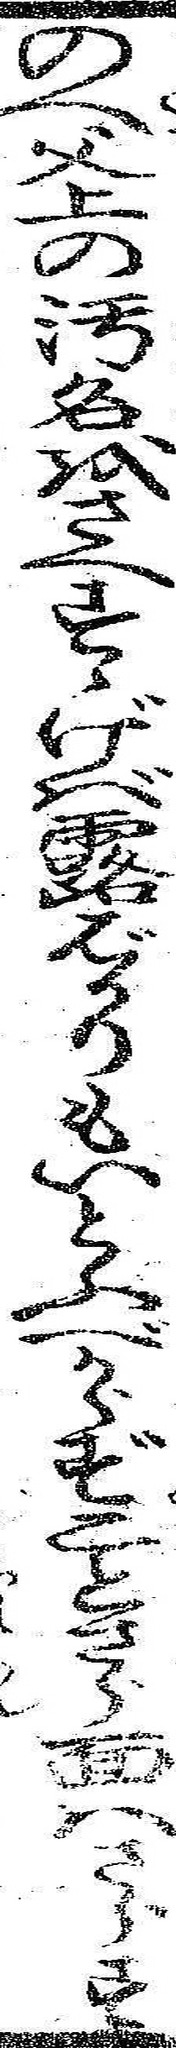のへ。父上の汚名をさへすゝげば。露ばかりもいとふべからず。ことさら面はさらす
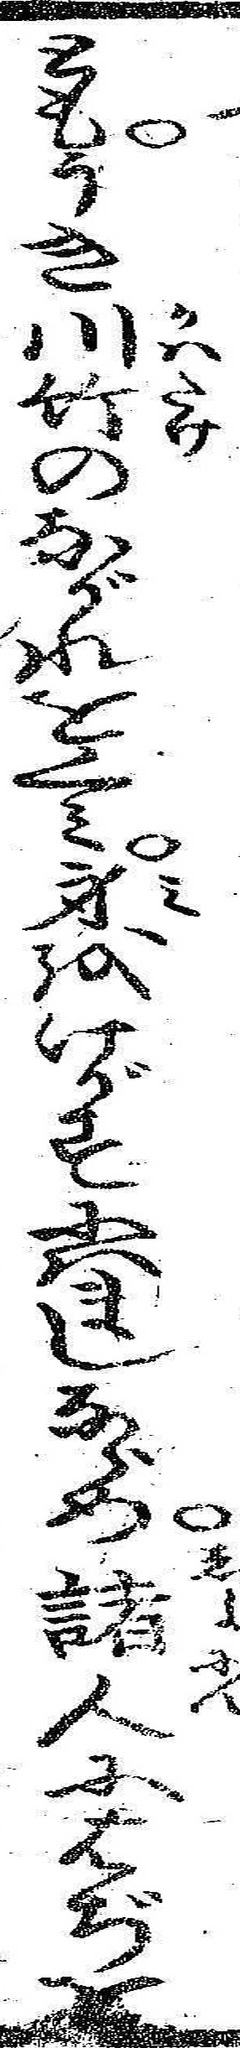とも。うき川竹のながれをくみ。身をけがすにはましならめ。諸人にはぢを
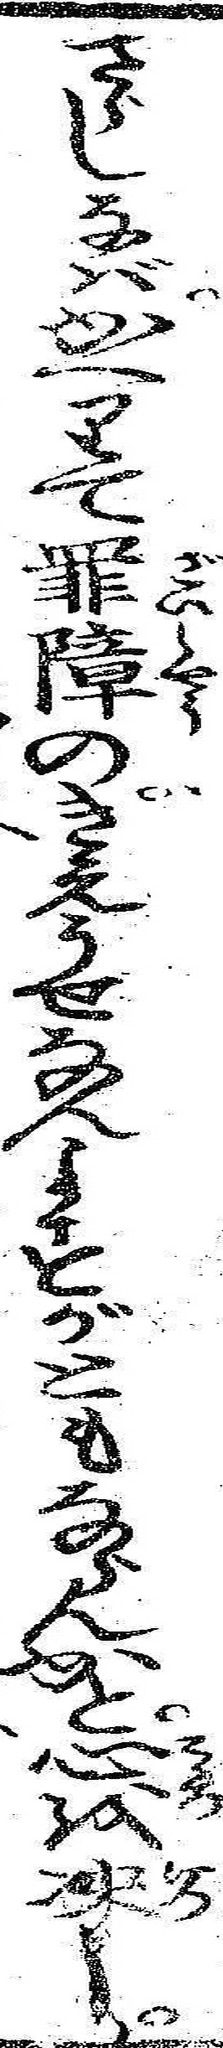さらしなば。かへりて罪障の。きえうせなんよすがともならんかと。心を決し。
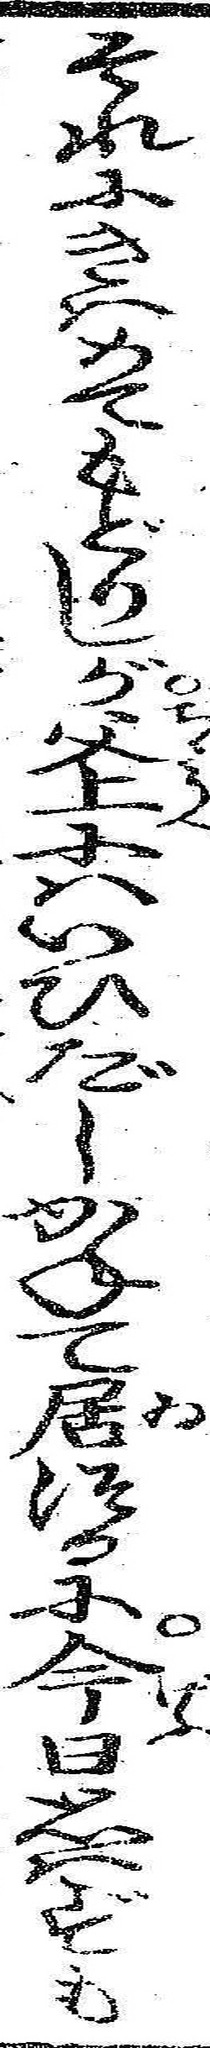それにきはめてもどりしが。父上にはいひだしかねて居つるに。今日思はずも
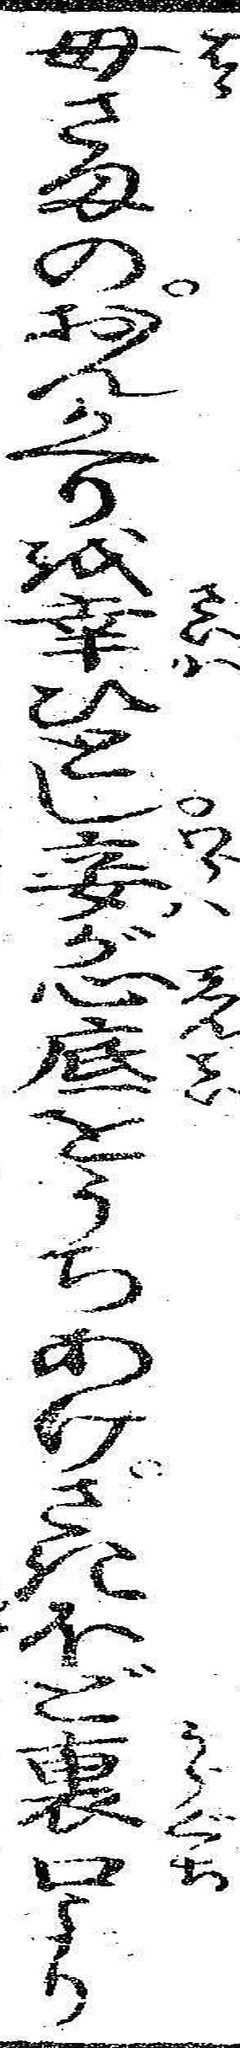母さまの。おんかへりを幸ひとし。妾が心底をうちあけ。さきほど裏口より
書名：昔話稲妻表紙
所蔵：国文学研究資料館
